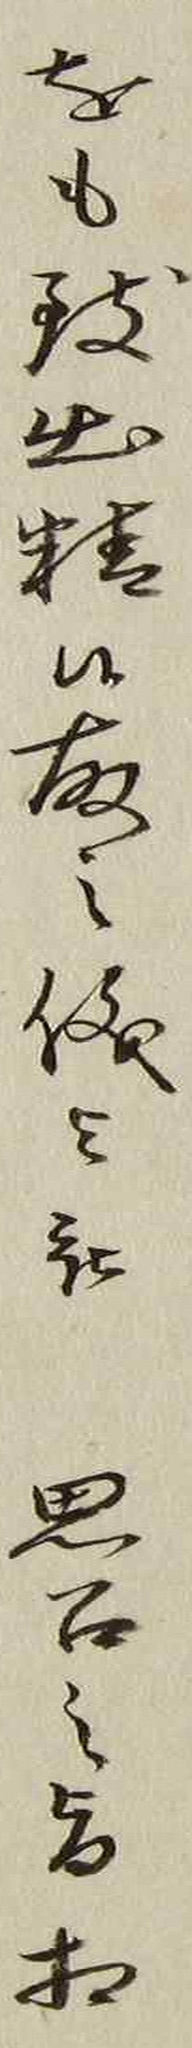をも致出精候故之儀与被思召之旨相
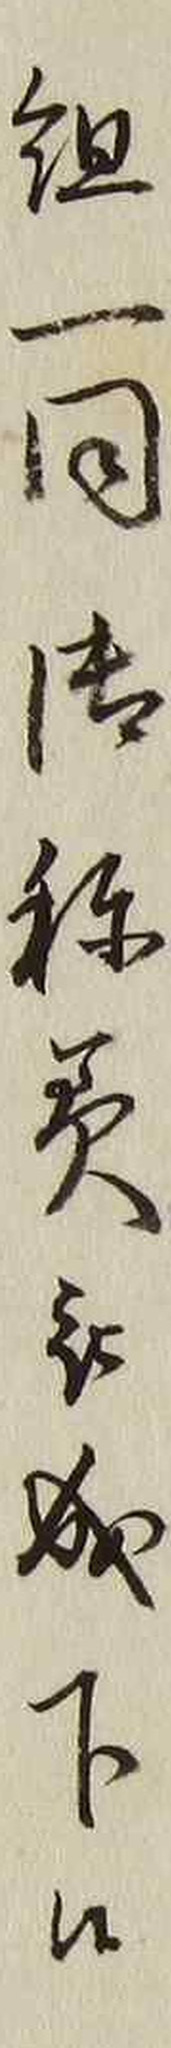組一同御称美被成下候
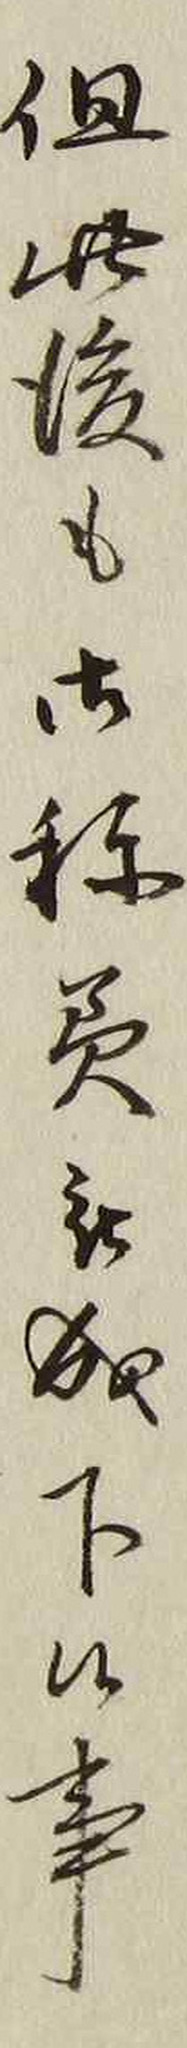但此後も御称美被成下候事
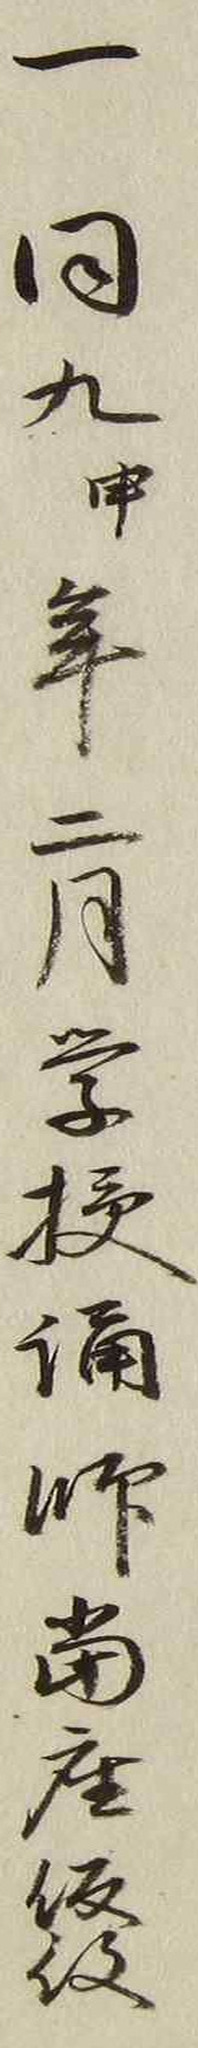一同九申年二月学校誦師当座仮役
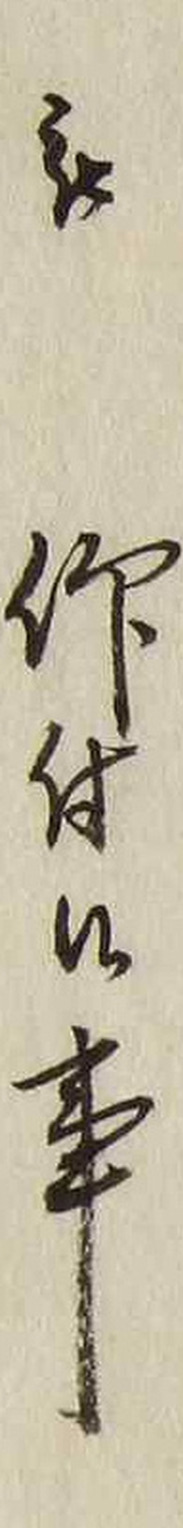被仰付候事

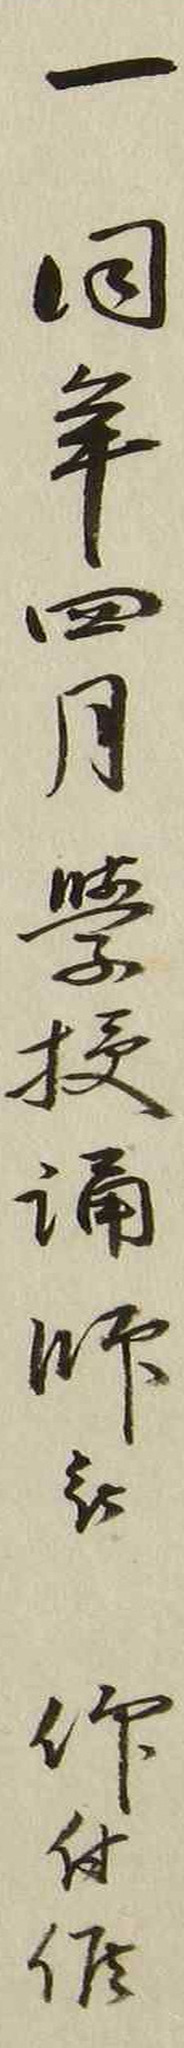一同年四月学校誦師被仰付候
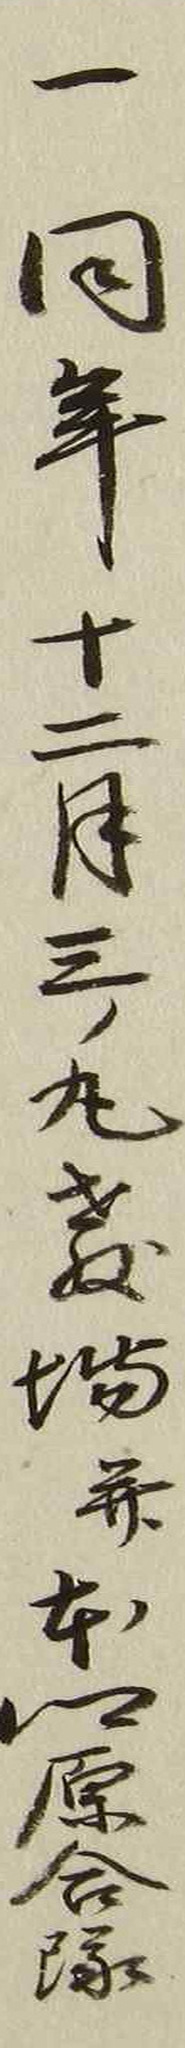一同年十二月三ノ丸教場并本郷原合隊
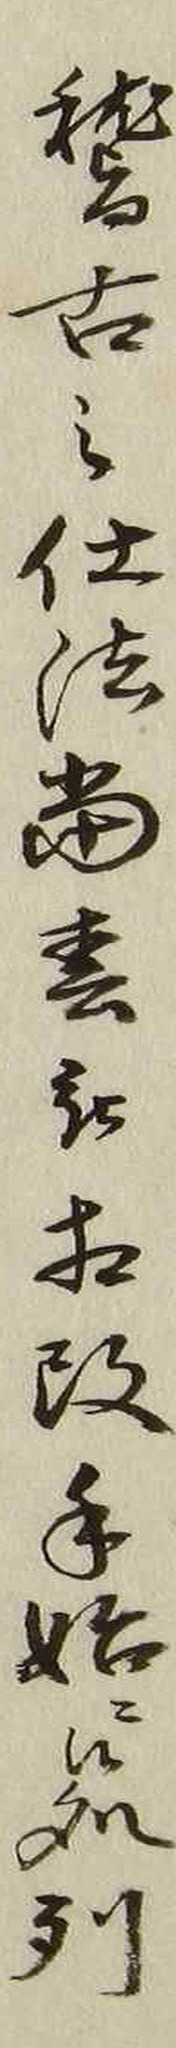稽古之仕法当春被相改手始ニ候処列
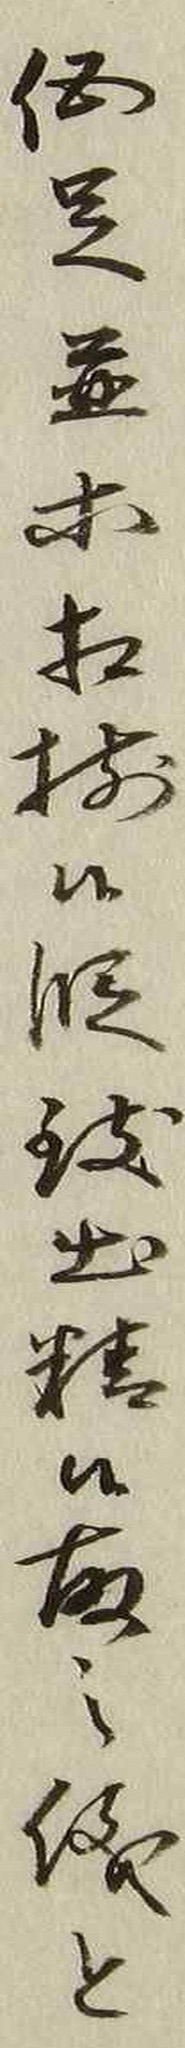伍足並等相揃候段致出精候故之儀と
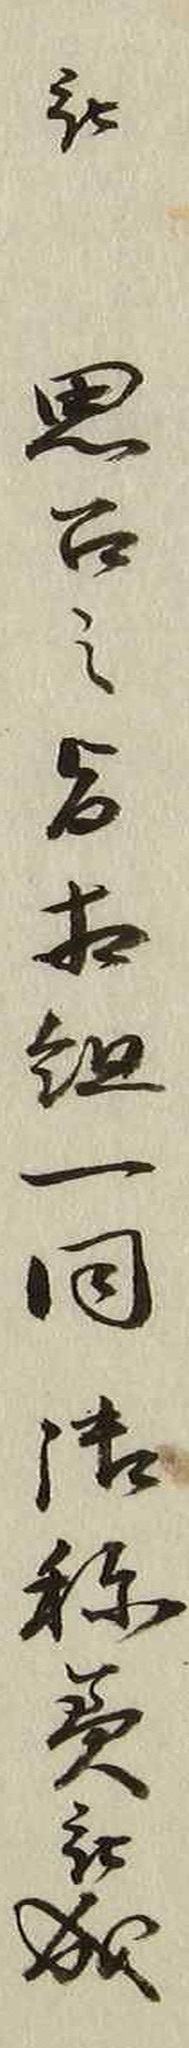被思召之旨相組一同御称美被成
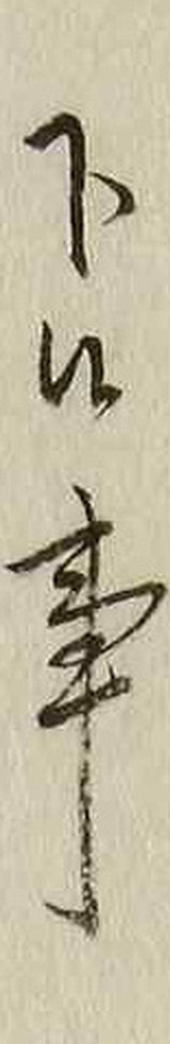下候事
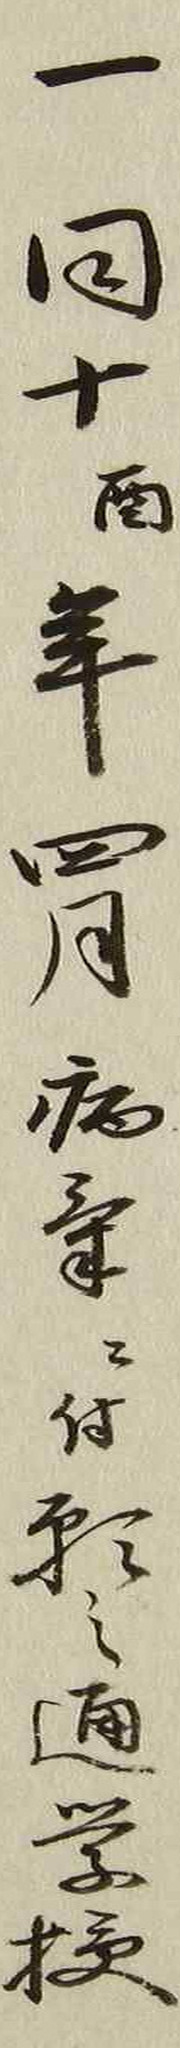一同十酉年四月病気ニ付願之通学校
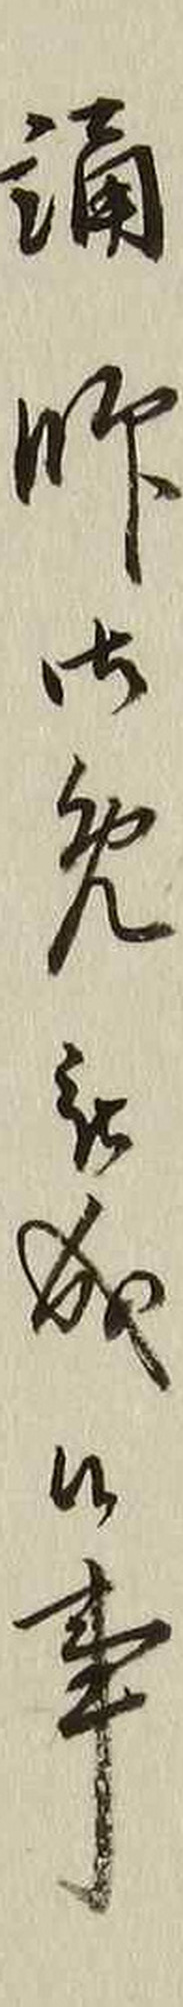誦師御免被成候事
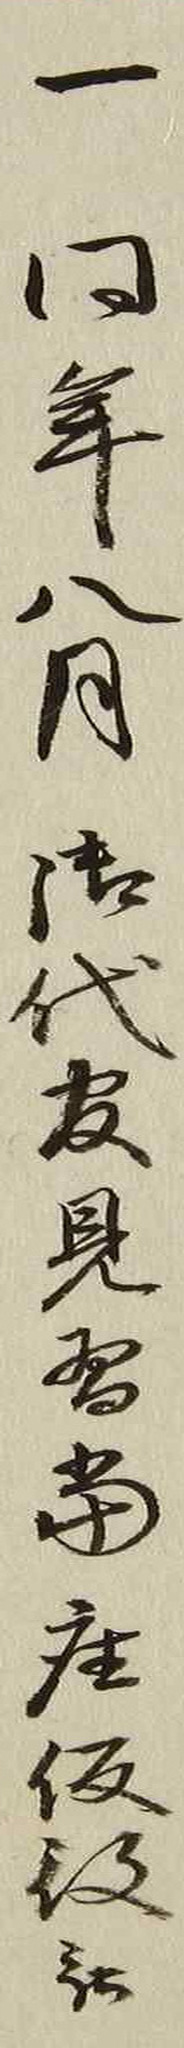一同年八月御代官見習当座仮役被
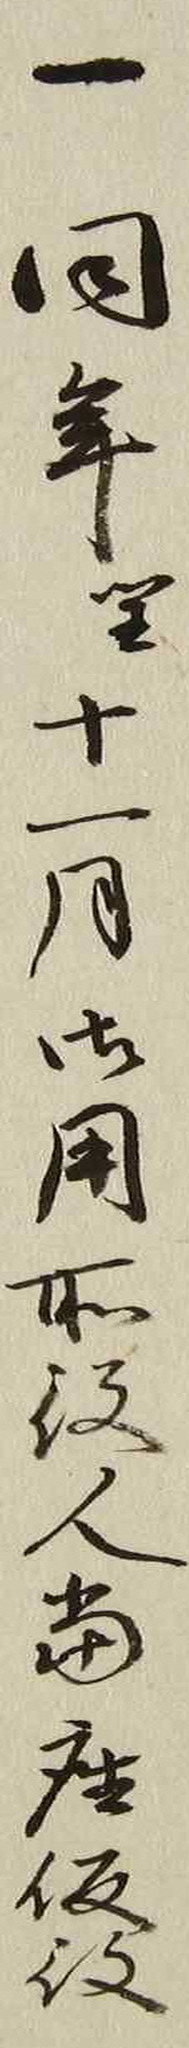一同年閏十一月御用所役人当座仮役
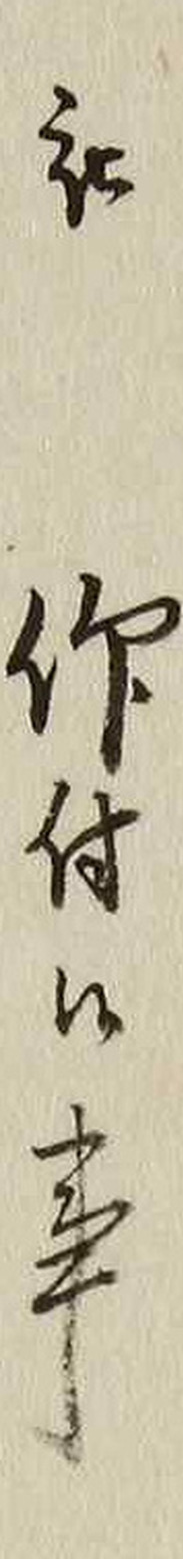被仰付候事
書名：諸士系譜　巻之149　そ之部2
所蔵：会津若松市立会津図書館
